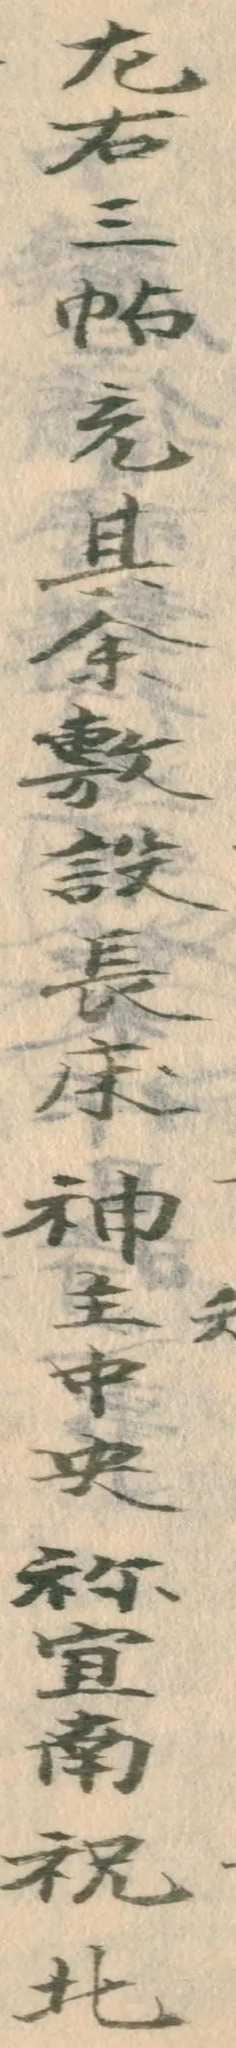左右三帖充其余敷設長床神主中央祢宜南祝北
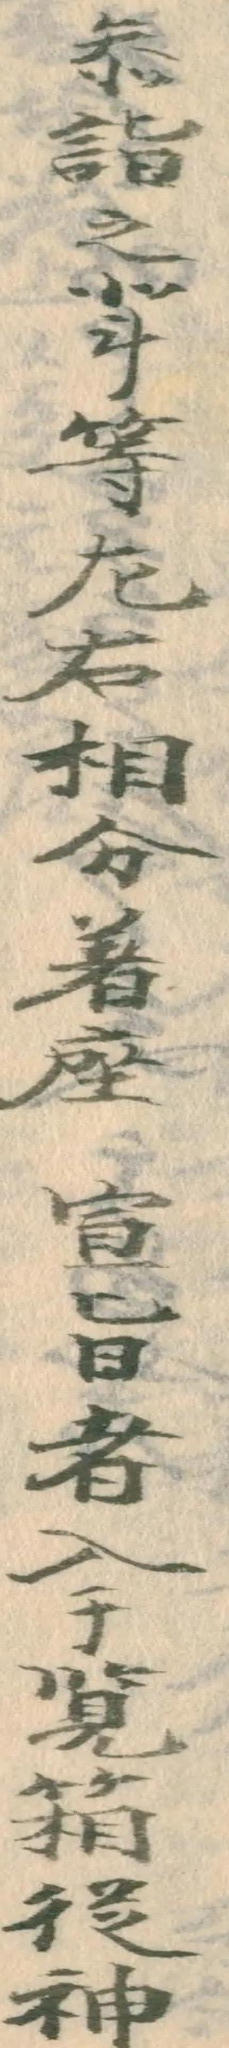参詣之輩等左右相分着座宣旨は入于覧箱従神
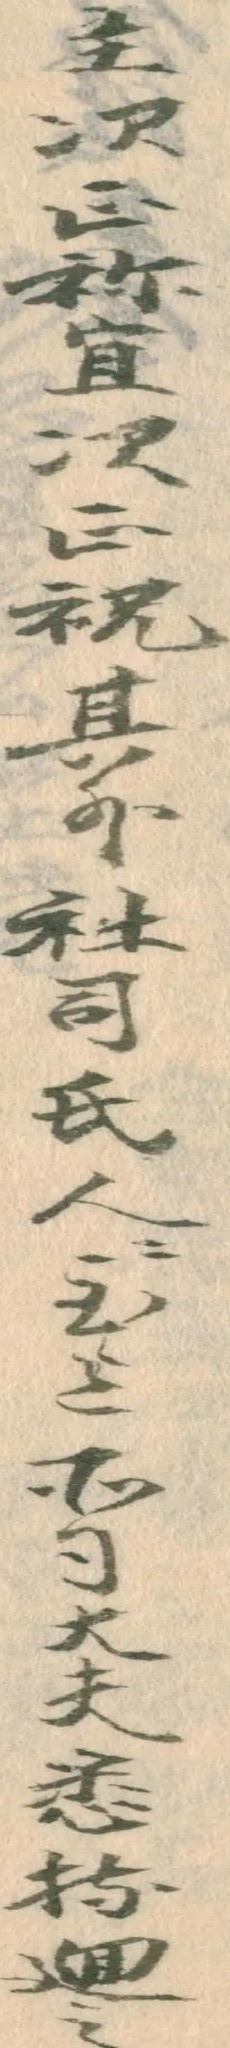主次正祢宜次正祝其外社司氏人ニ至迄所司大夫悉持廻之
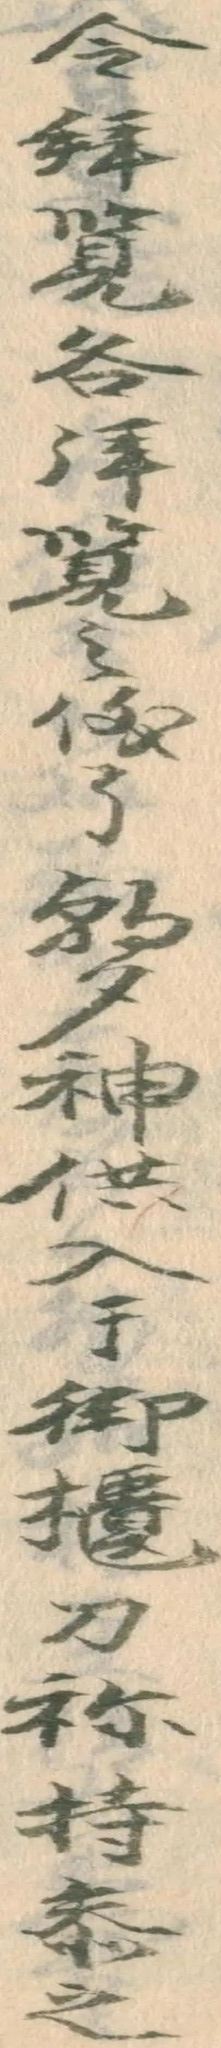令拝覧各拝覧之儀了朝夕神供入于御櫃刀祢持参之
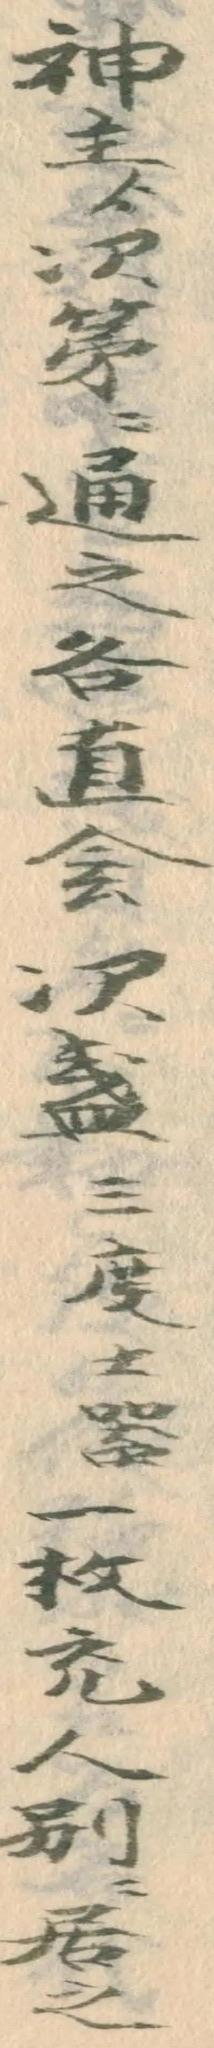神主ゟ次第ニ通之各直会次盞三度土器一枚充人別ニ居之
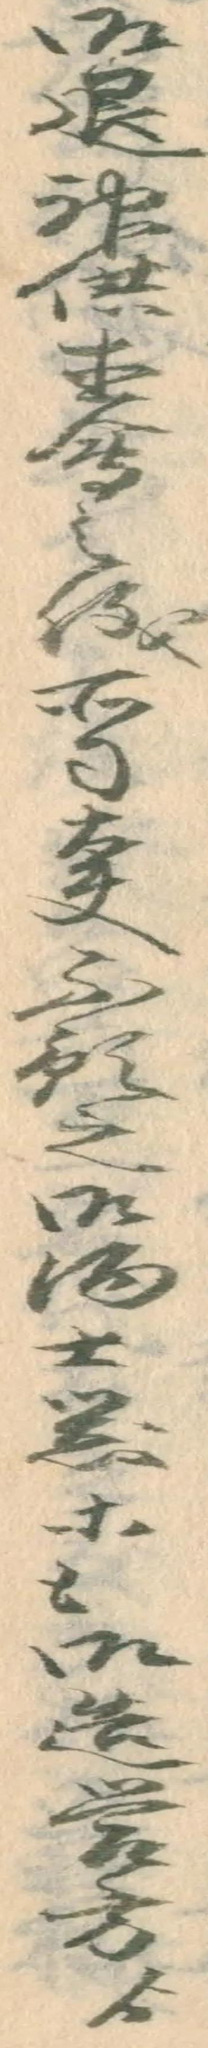御退神供直会之儀所司大夫不預之御酒士器等も御造営方ゟ

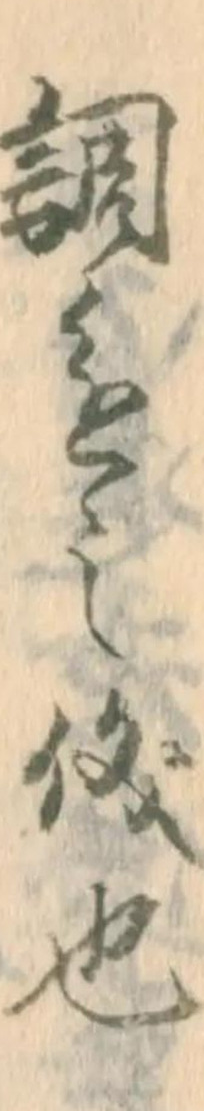調進之儀也
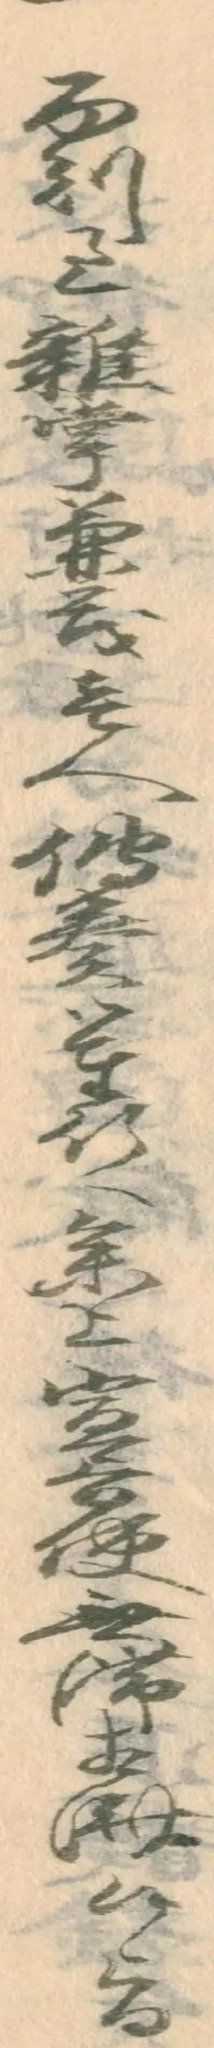一酉刻過雑掌兼茂壱人伝奏御奉行へ参上宣旨使無滞相済候旨
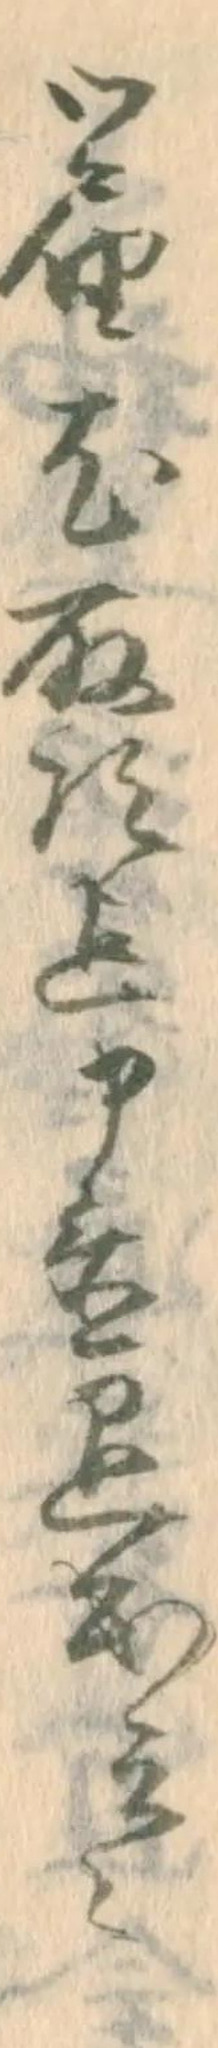御届尤取次迄申置退出云々
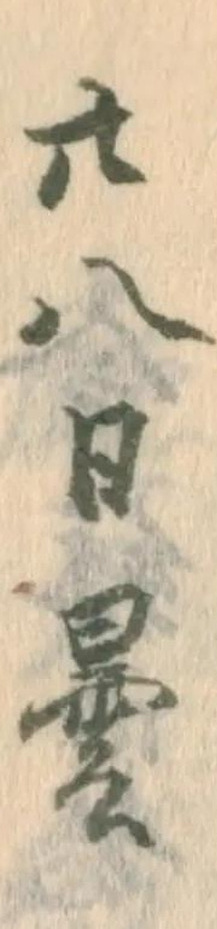廿八日曇
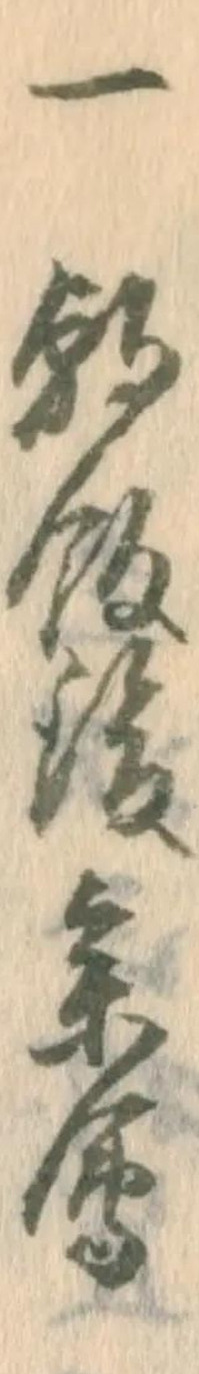一朝飯後参会
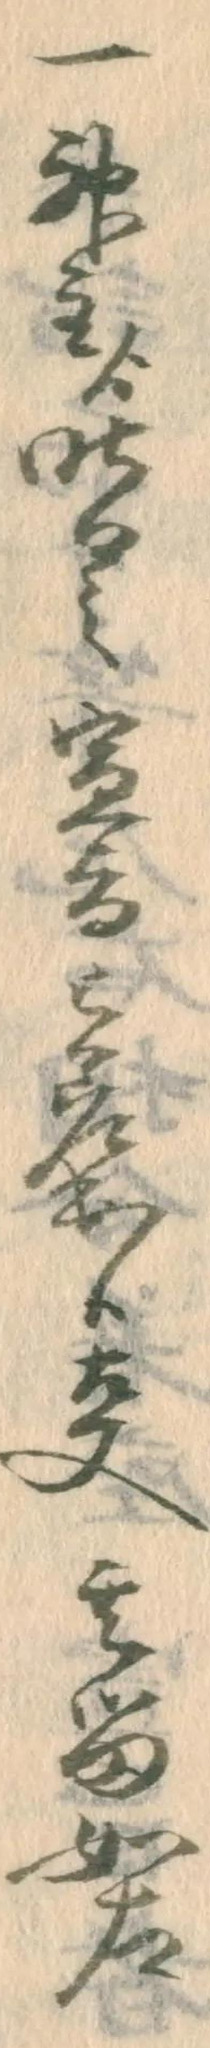一神主ゟ昨日之宣旨被差出候事其留如左
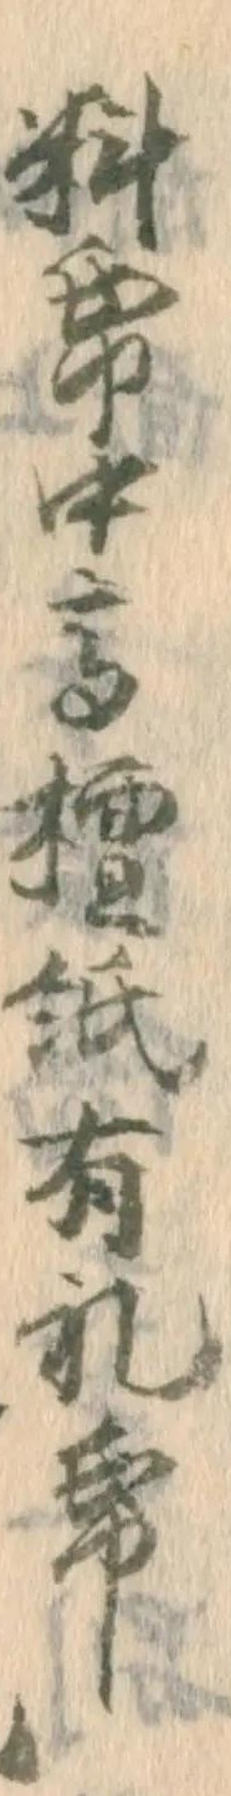料帋中高檀紙有礼帋
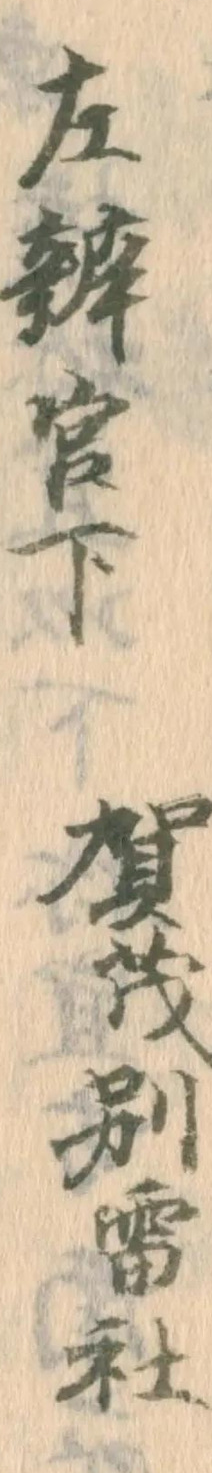左弁官下賀茂別雷社
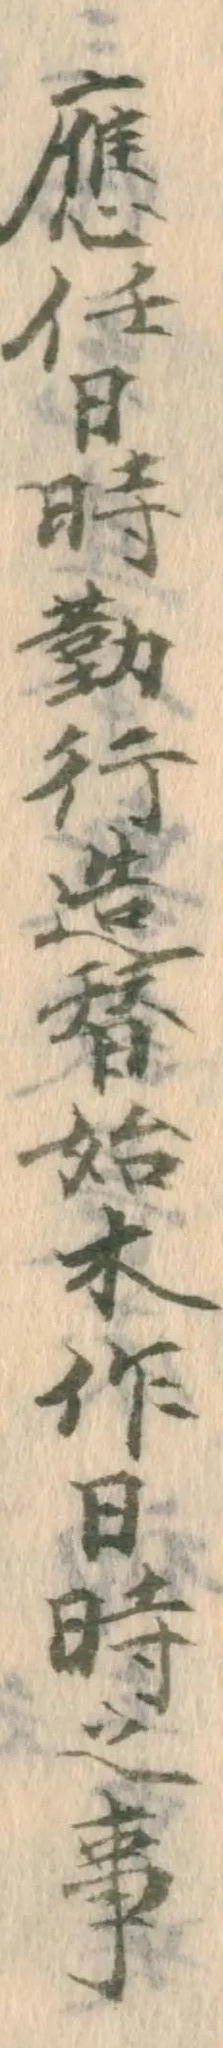応任日時勤行造替始木作日時之事
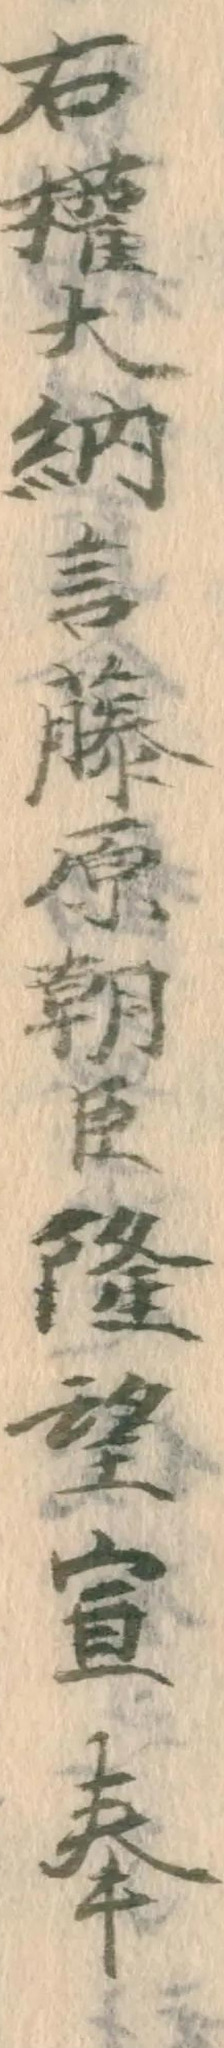右権大納言藤原朝臣隆望宣奉
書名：賀茂社記録. 第17冊
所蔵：国立国会図書館 National Diet Library, JAPAN
